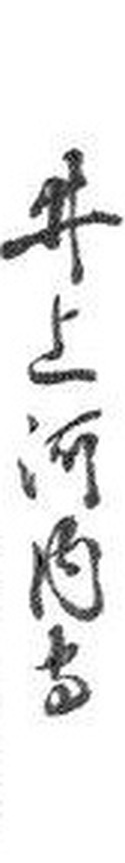井上河内守
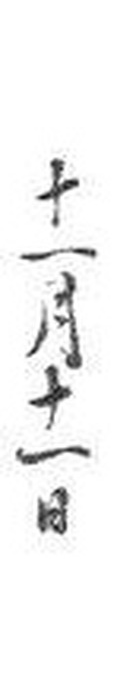一十一月十一日
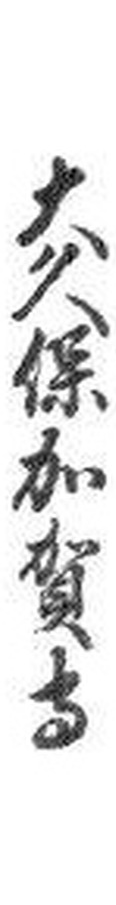大久保加賀守
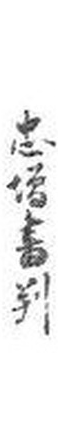忠増書判
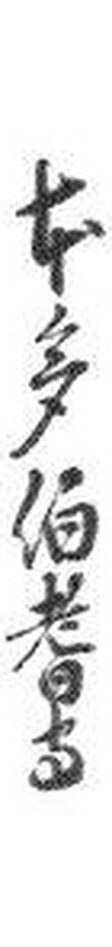本多伯耆守
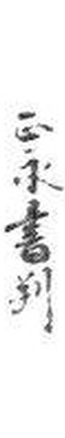正永書判
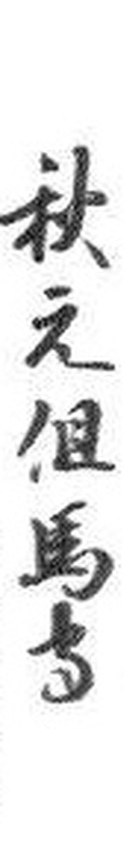秋元但馬守
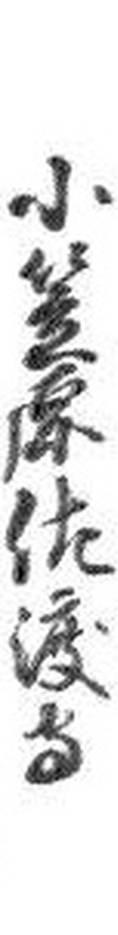小笠原佐渡守
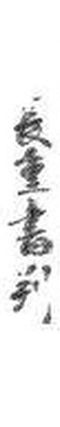長重書判
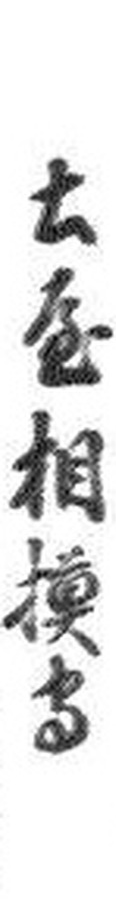土屋相模守
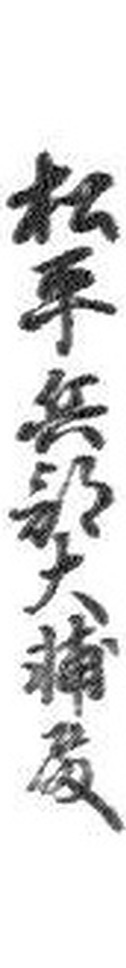松平兵部大輔殿
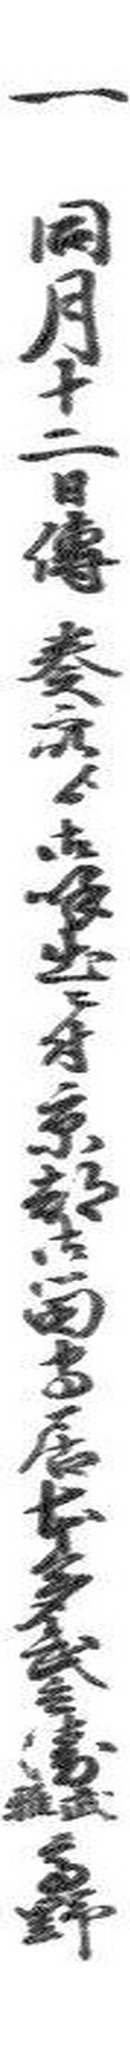一同月十二日傳奏衆ゟ御呼出ニ付京都御留守居本多武兵衛武雅高野
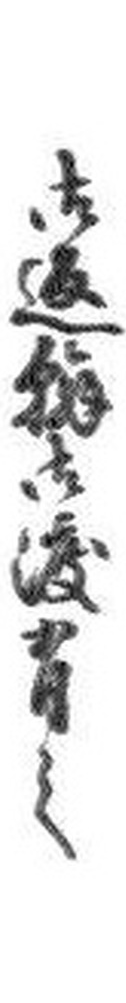御返翰御渡有之
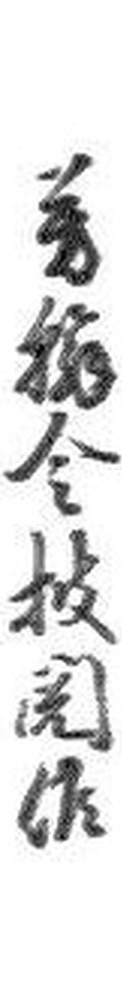芳翰令披閲候

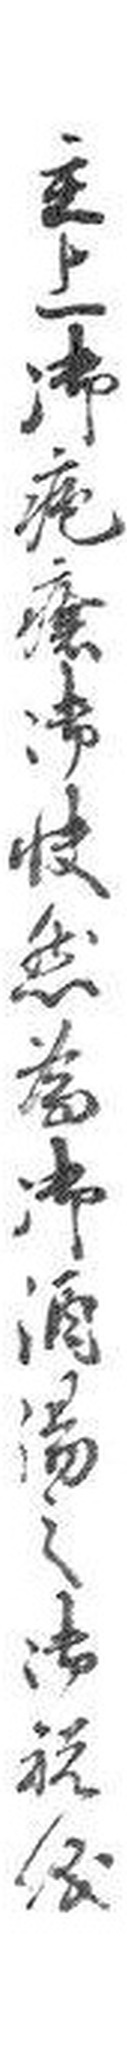主上御疱瘡御快然為御酒湯之御祝儀
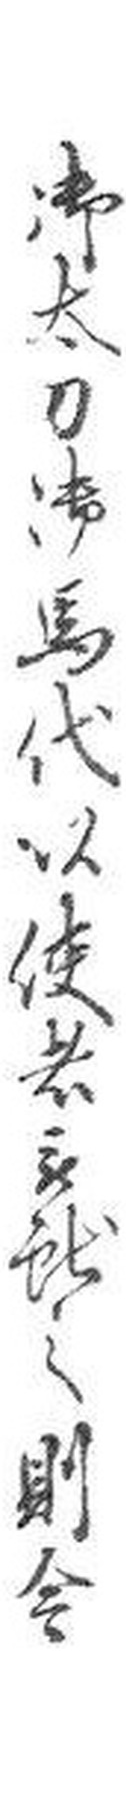御太刀御馬代以使者被献之則令
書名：家譜 二十五 吉品公 従宝永六年到同七年
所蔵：福井県文書館 Fukui Prefectural Archives
